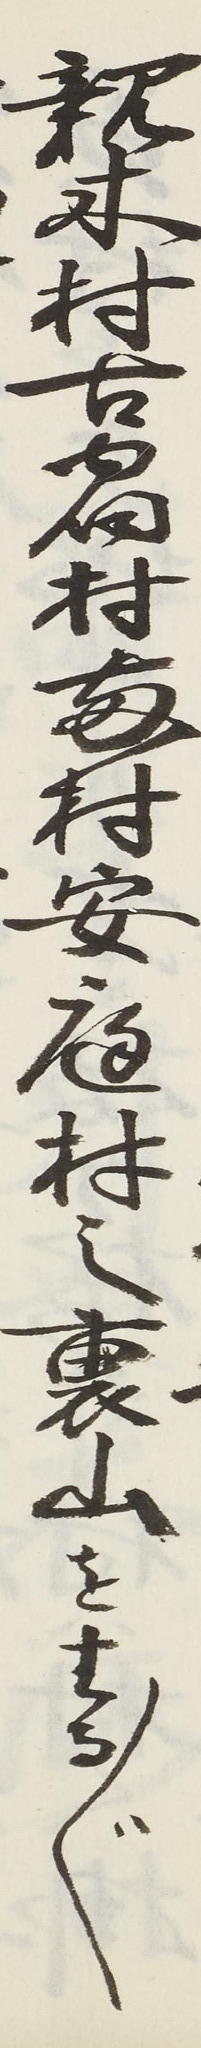親木村古宿村両村安庭村之裏山をはる〴〵
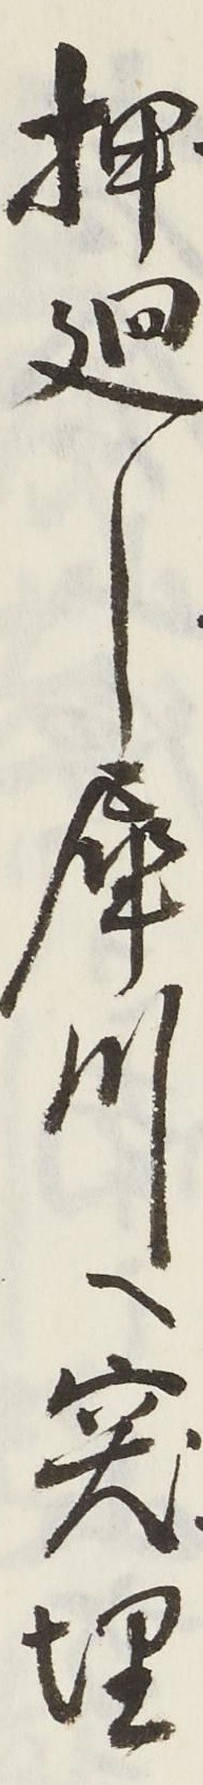押廻し犀川へ突埋
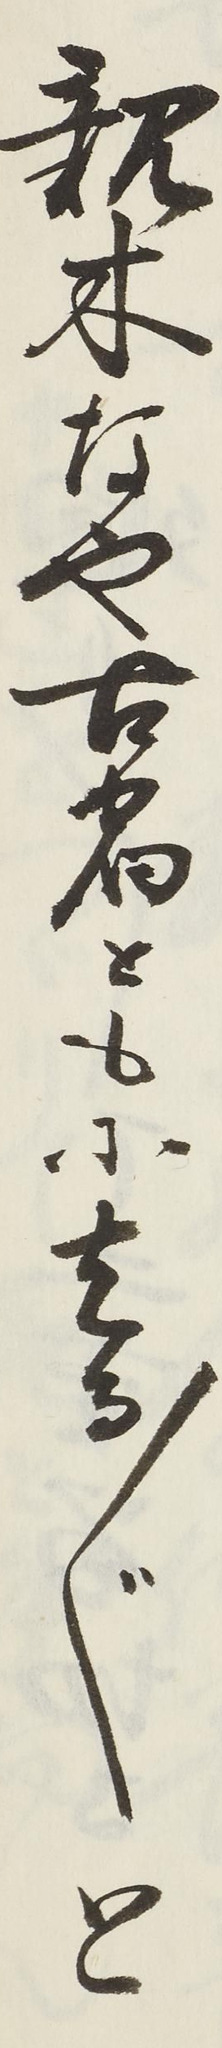親木なや古宿ともにはる〴〵と

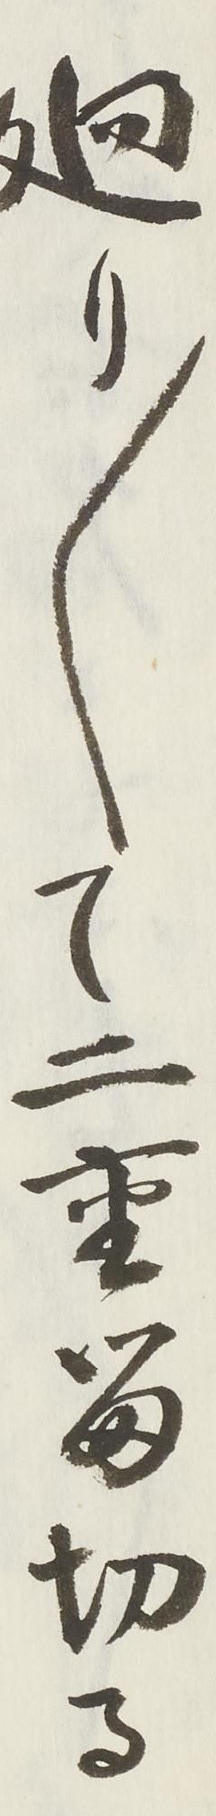廻り〳〵て二重留切る
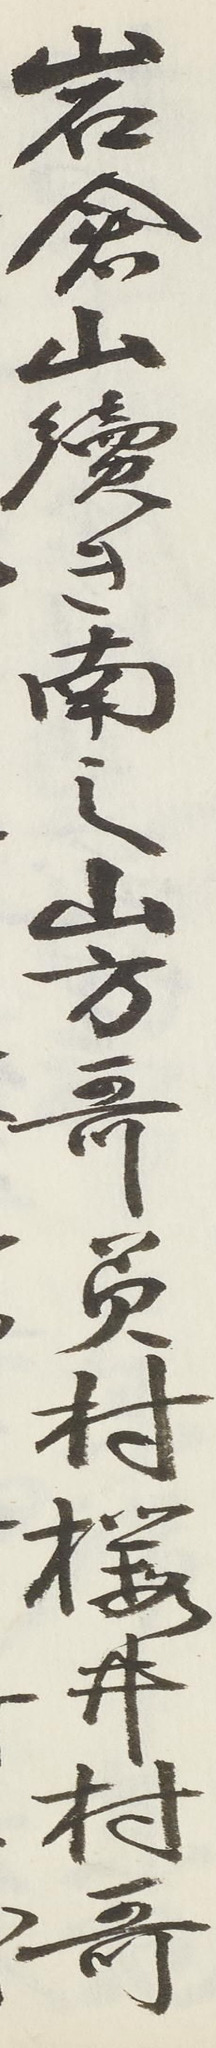岩倉山続き南之山方哥美村桜井村哥
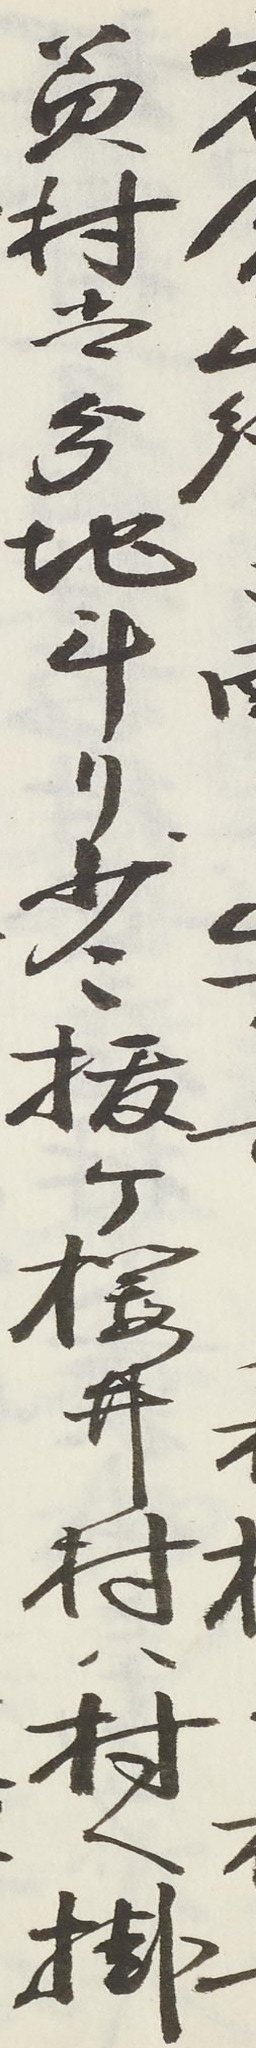美村は分地斗り少々抜ヶ桜井村ハ村へ掛
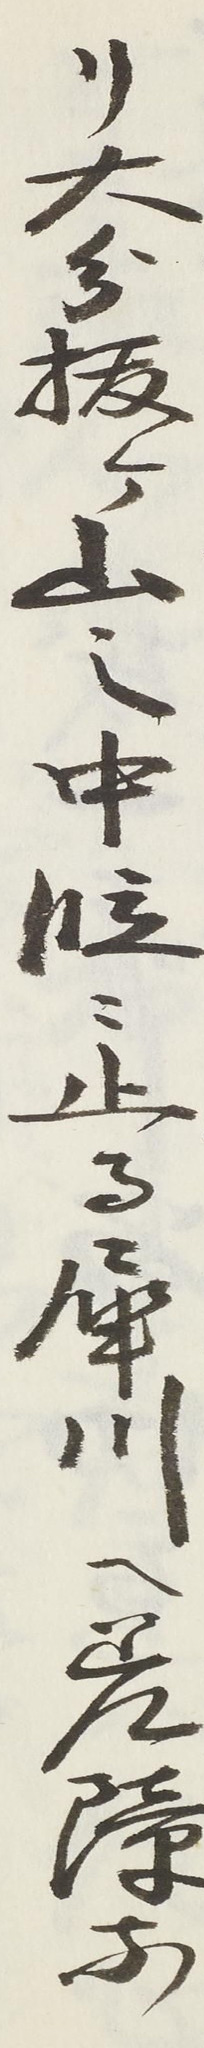り大分抜ヶ山之中段二止る犀川へ差障な
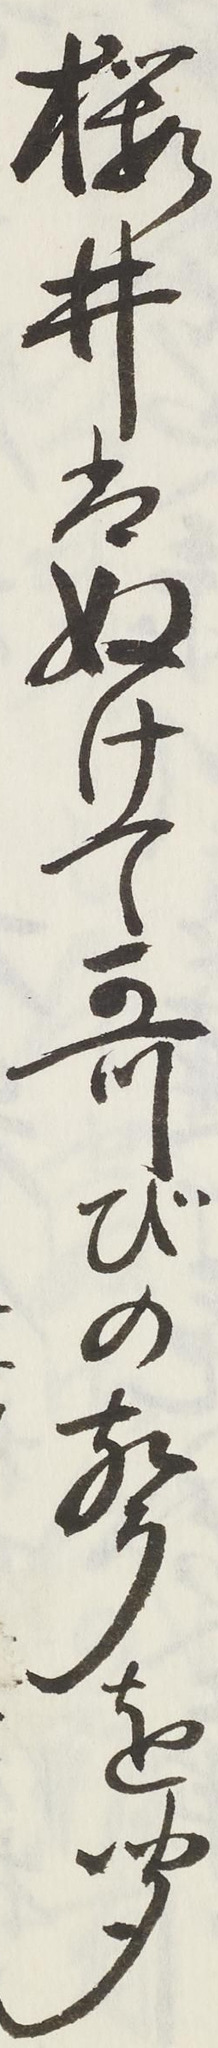桜井はぬけて哥びの声を聞
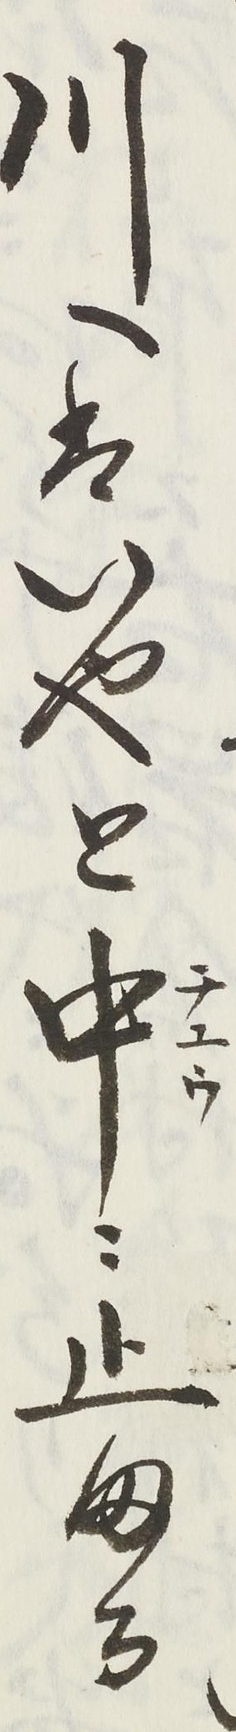川へはいやと中二止まる
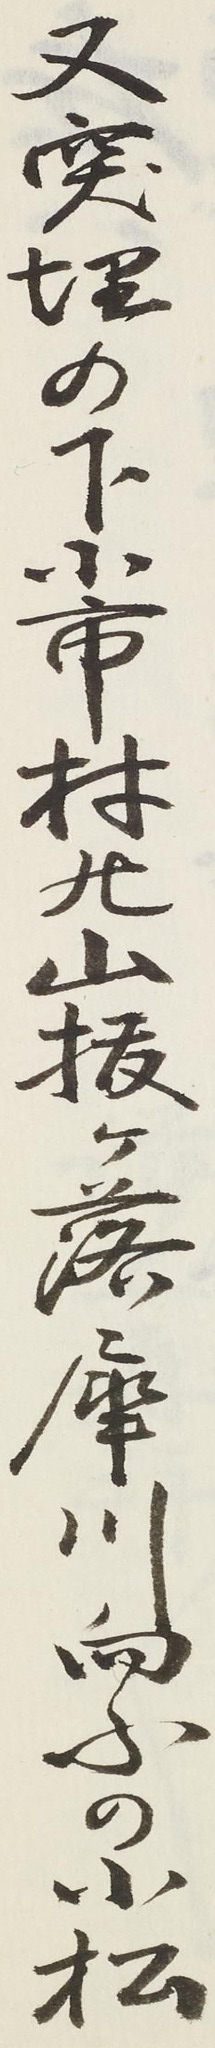又突埋の下小市村の山抜ヶ落犀川向ふの小松
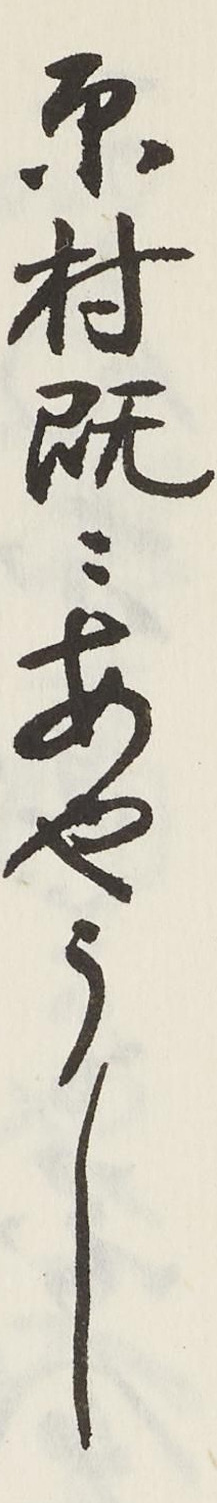原村既二あやうし
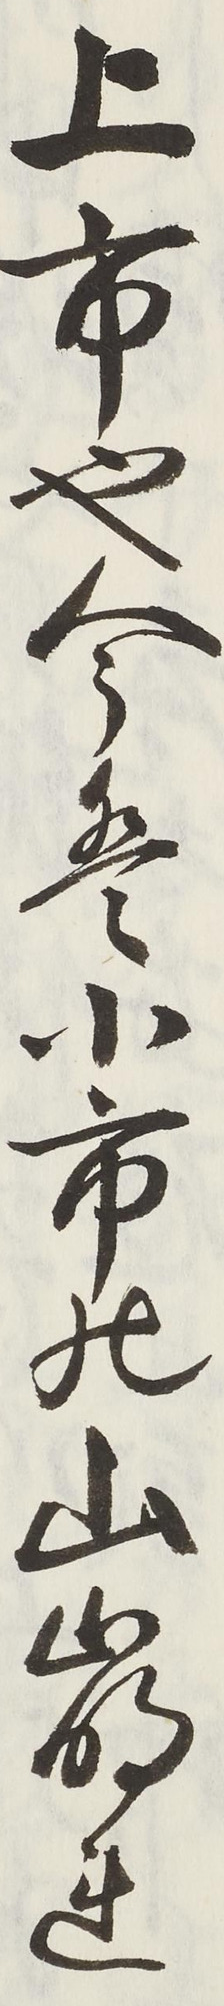上市や今は小市の山崩れ
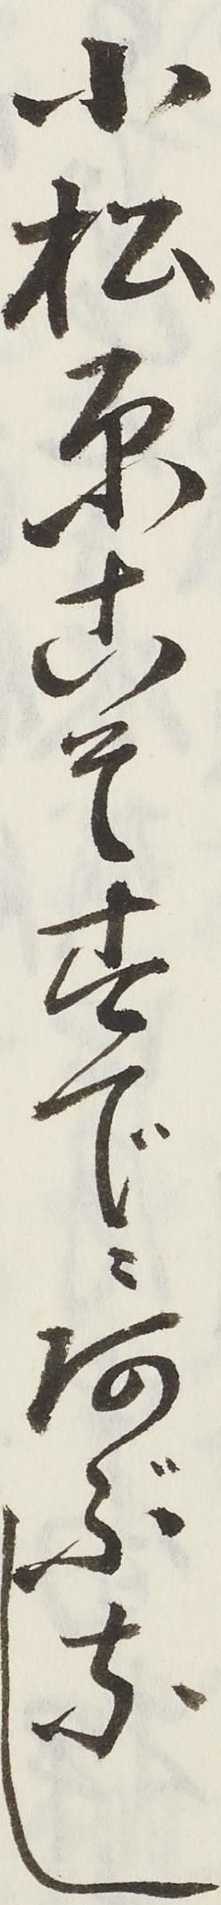小松原こそすで二あぶなし
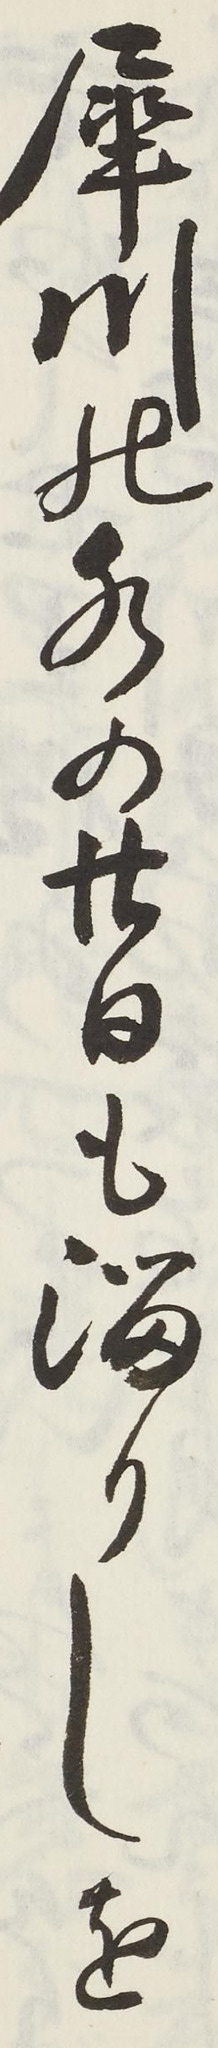犀川の水の廿日も溜りしを
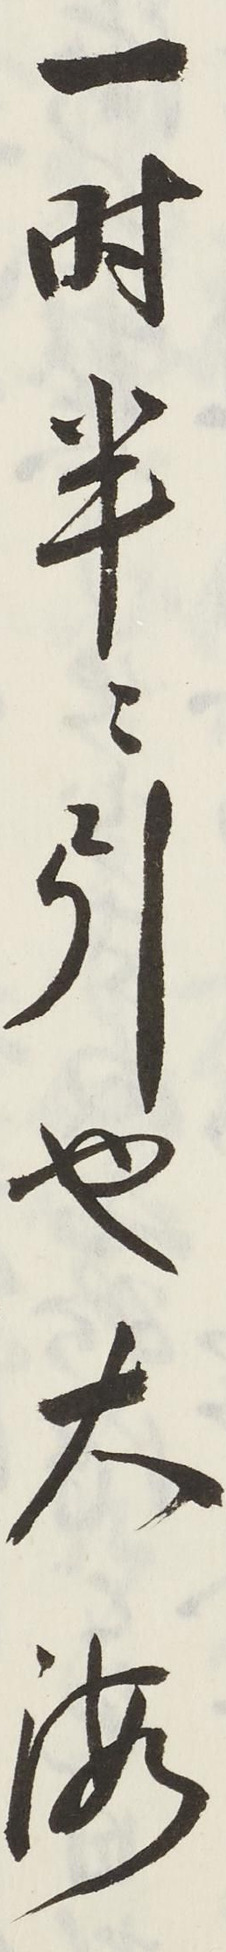一時半二引くや大海
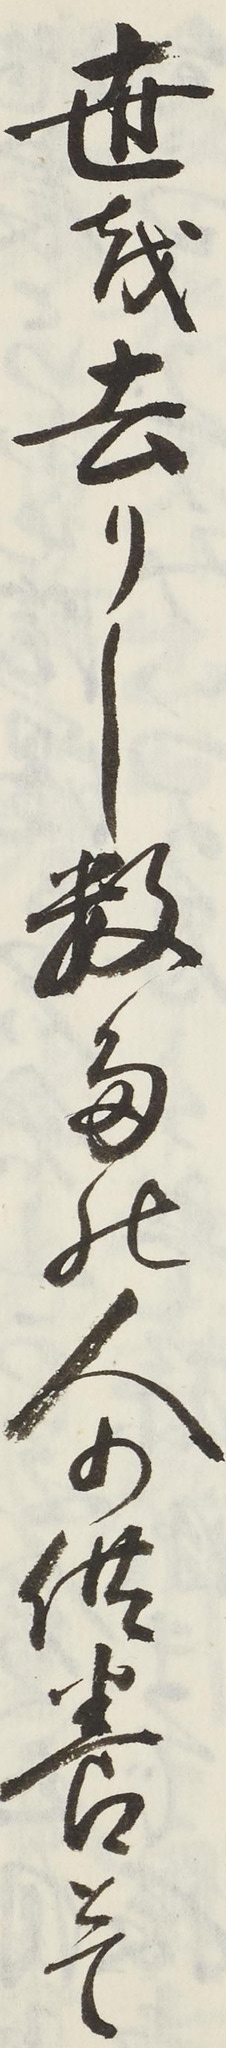世を去りし数多の人の供養とて
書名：弘化四年地震記
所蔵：東京大学地震研究所図書室 Earthquake Research Institute Library, The University of Tokyo, JAPAN
